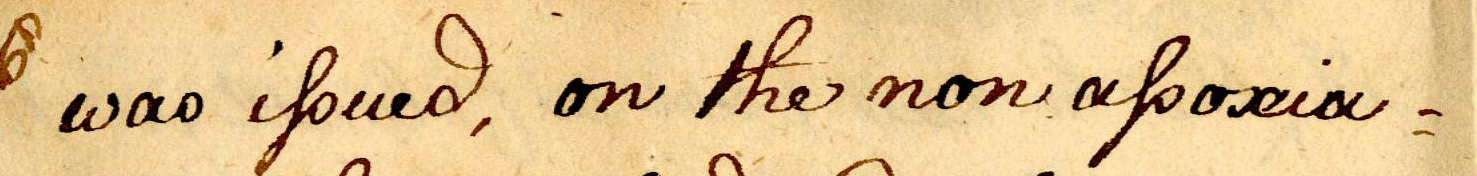was issued, on the non associa-
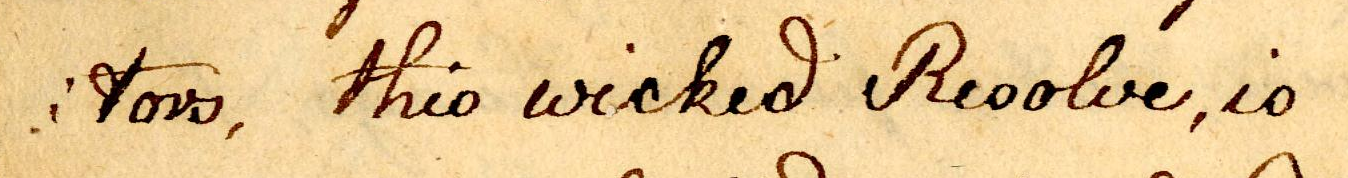-tors, this wicked Resolve, is
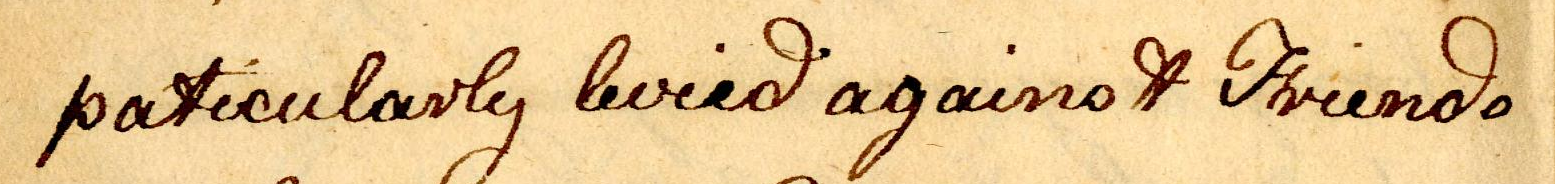paticularly levied against Friends
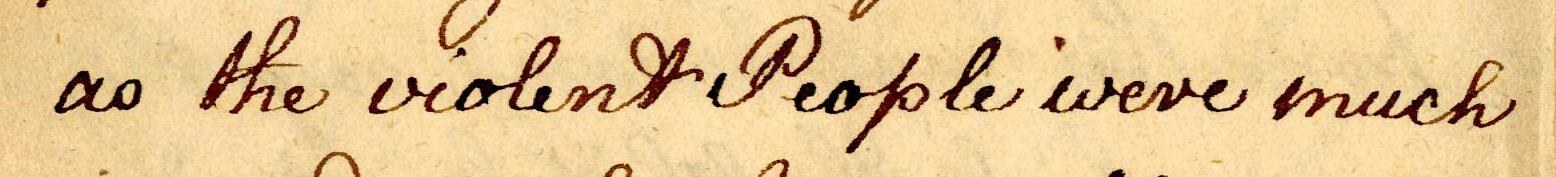as the violent People were much
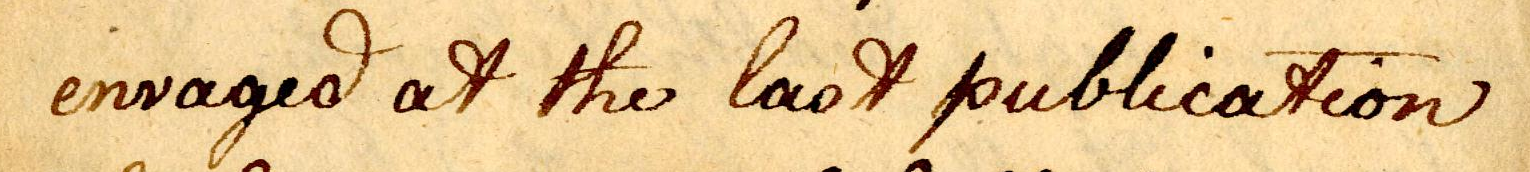enraged at the last publication
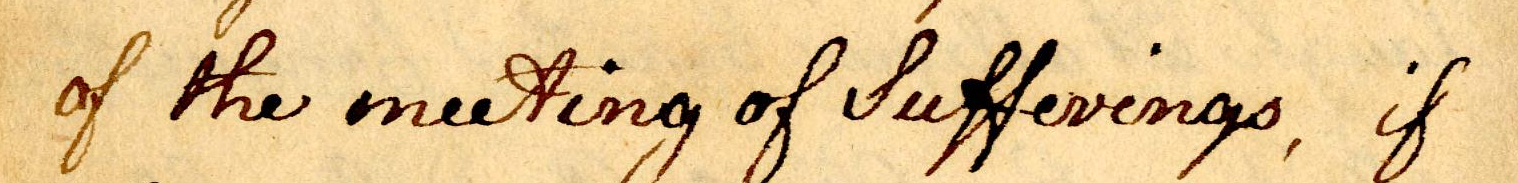of the meeting of Sufferings, if
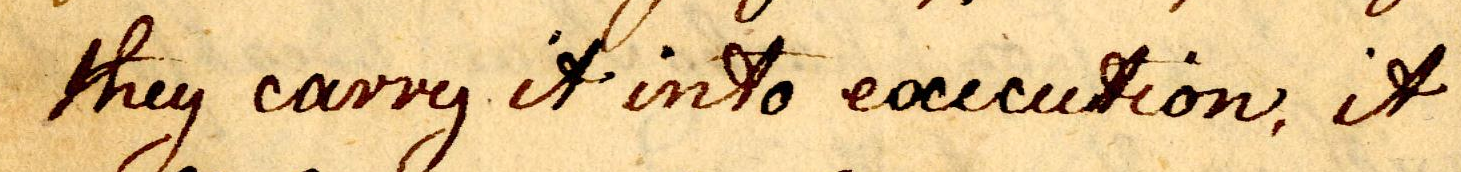they carry it into execution, it
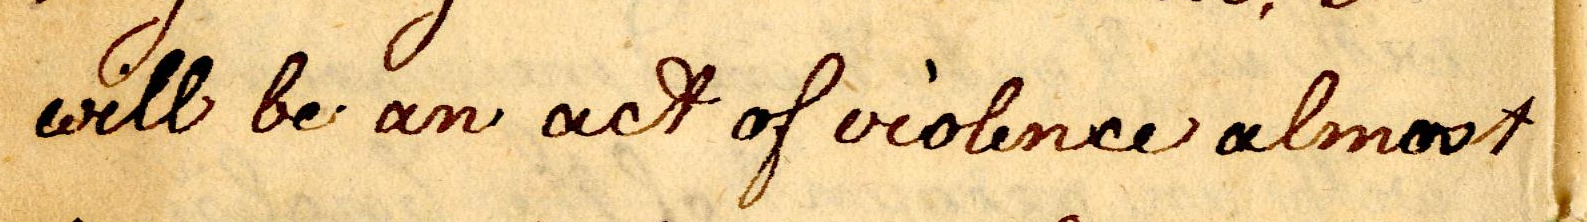will be an act of violence almost
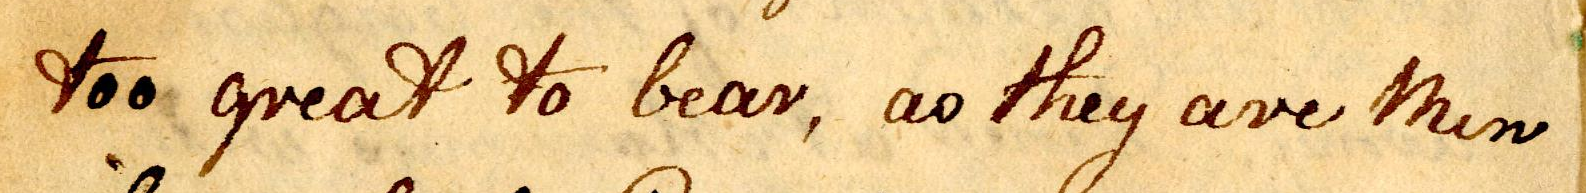too great to bear, as they are Men
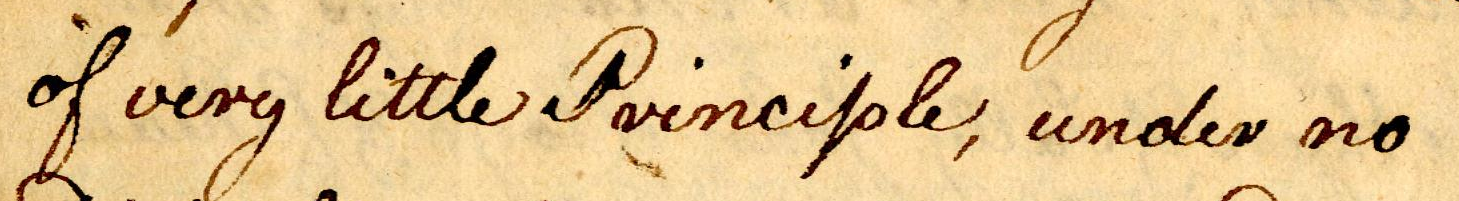of very little Principle, under no
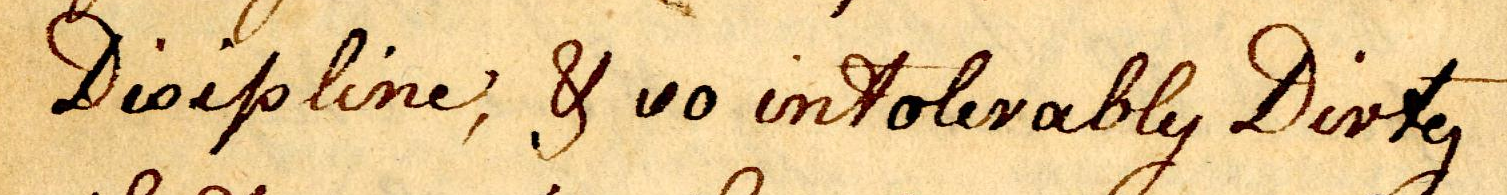Disipline, & so intolerably Dirty
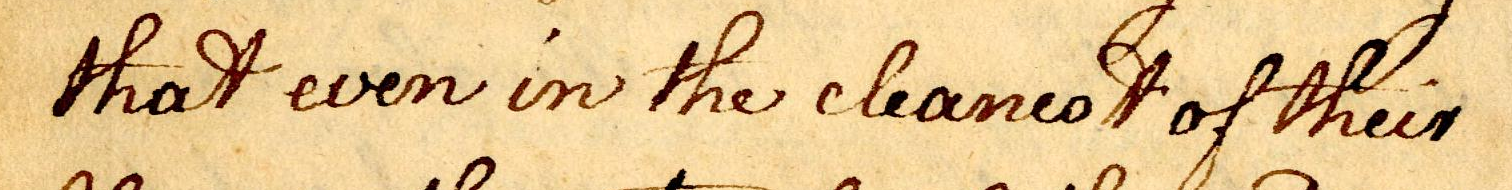that even in the cleanest of their
